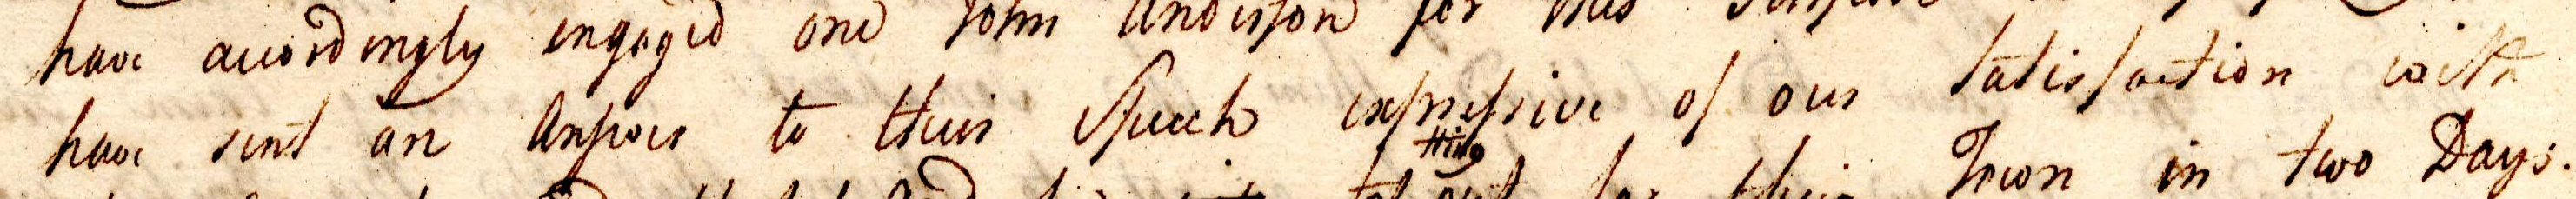have sent an Answer to their Speech expressive of our Satisfaction with
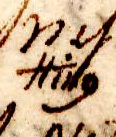tting
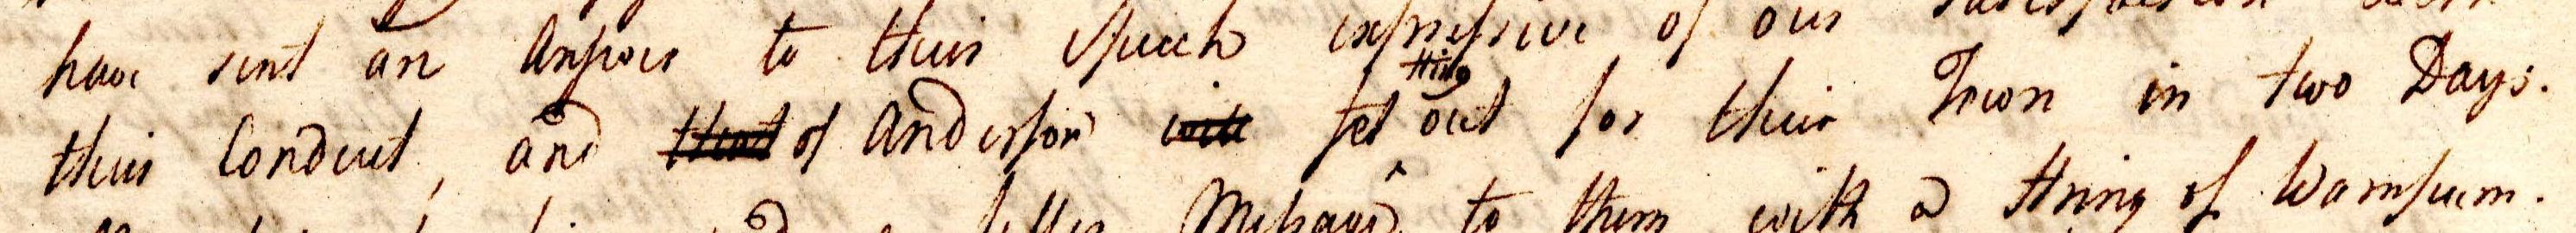this Conduct, and [that] of Anderson [will] set ^ out for their Town in two Days.
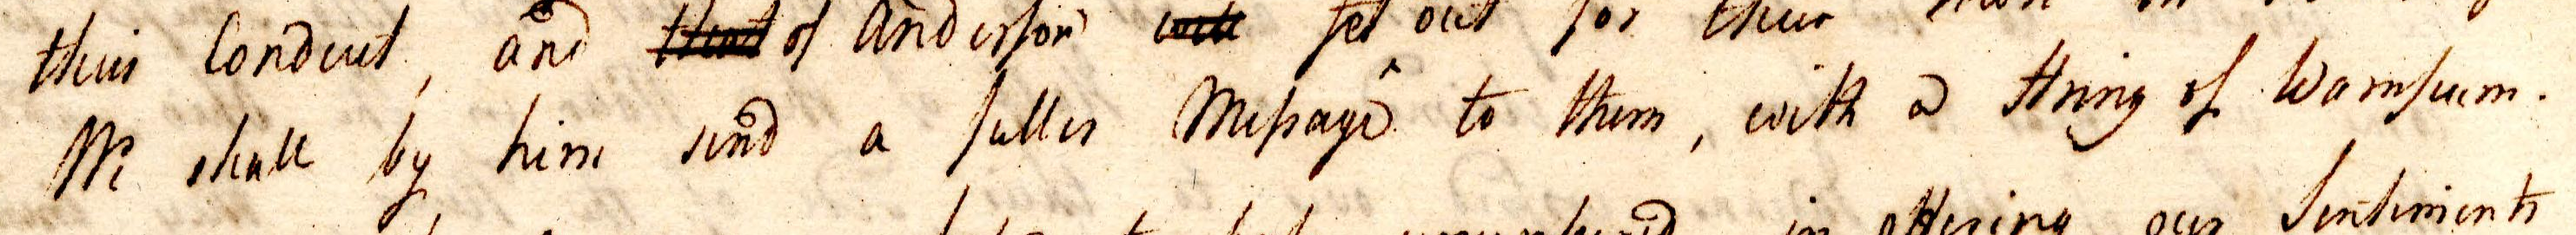We shall by him send a fuller Message to them, with a String of Wampum.
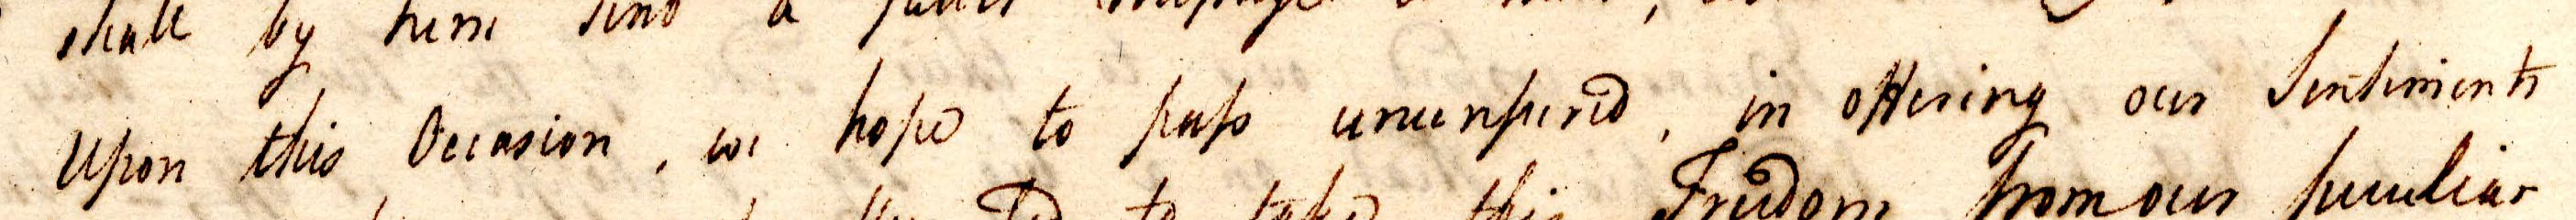Upon this Occasion, we hope to pass uncensured in offering our Sentiments
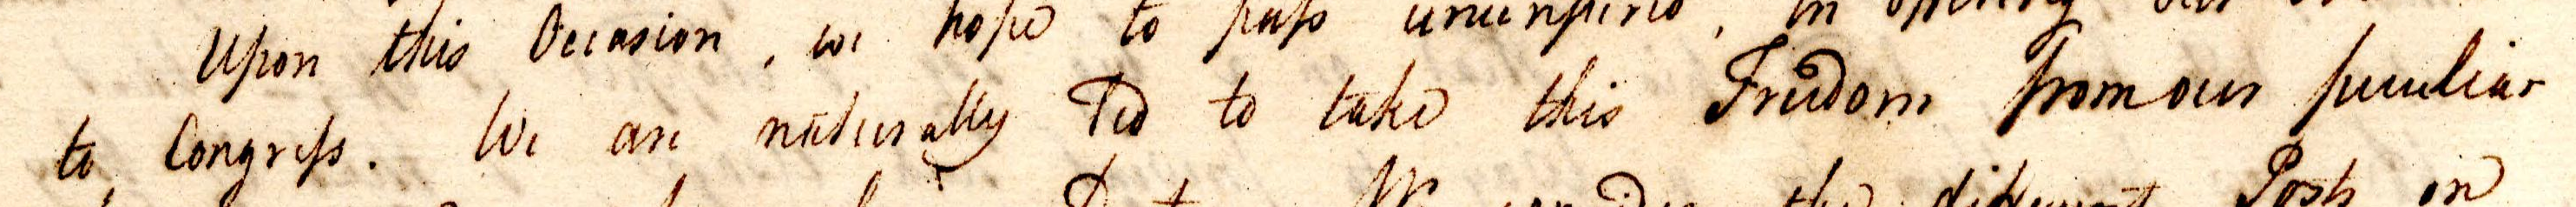to Congress. We are naturally led to take this Freedom from our peculiar
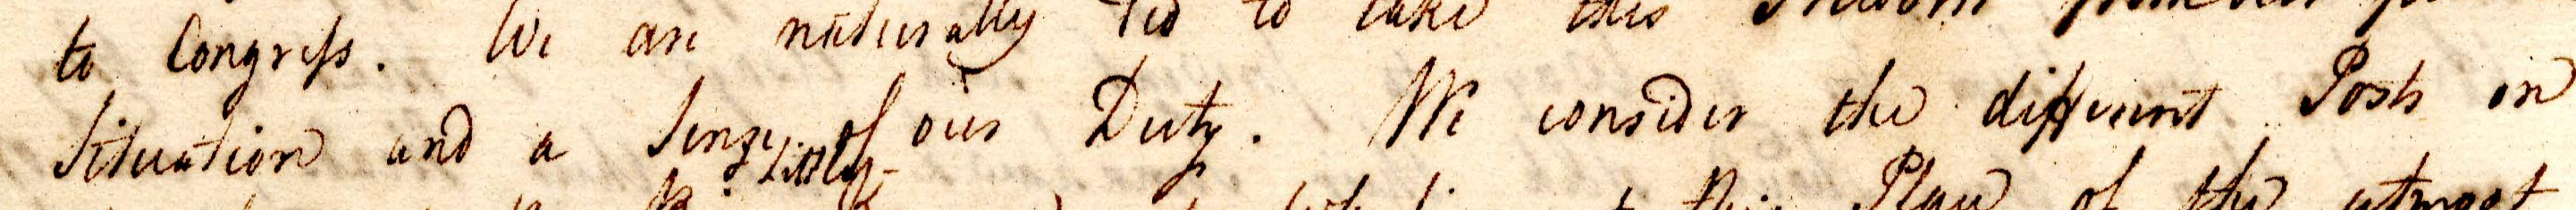Situation and a Sense of our Duty. We consider the different Posts on
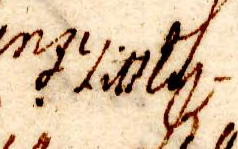& Little-
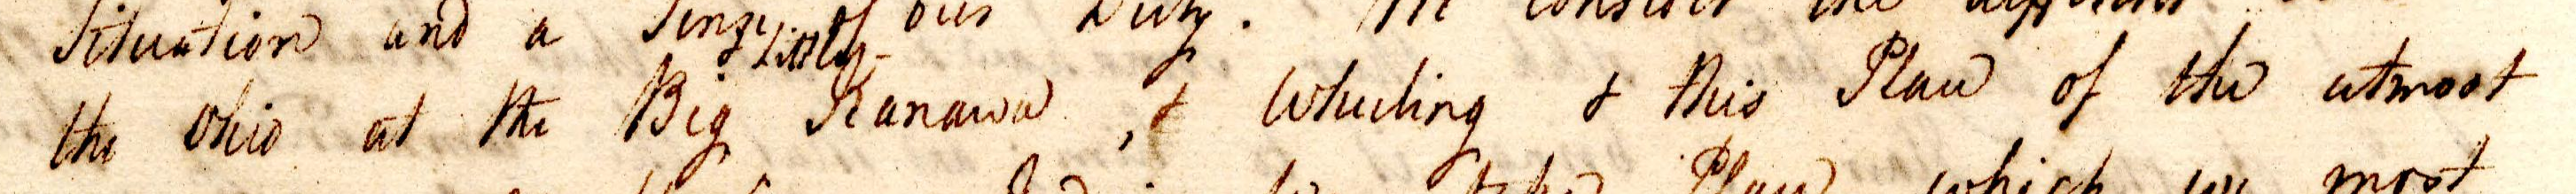the Ohio at the Big ^ Kanawa, & Wheeling & this Place of the utmost
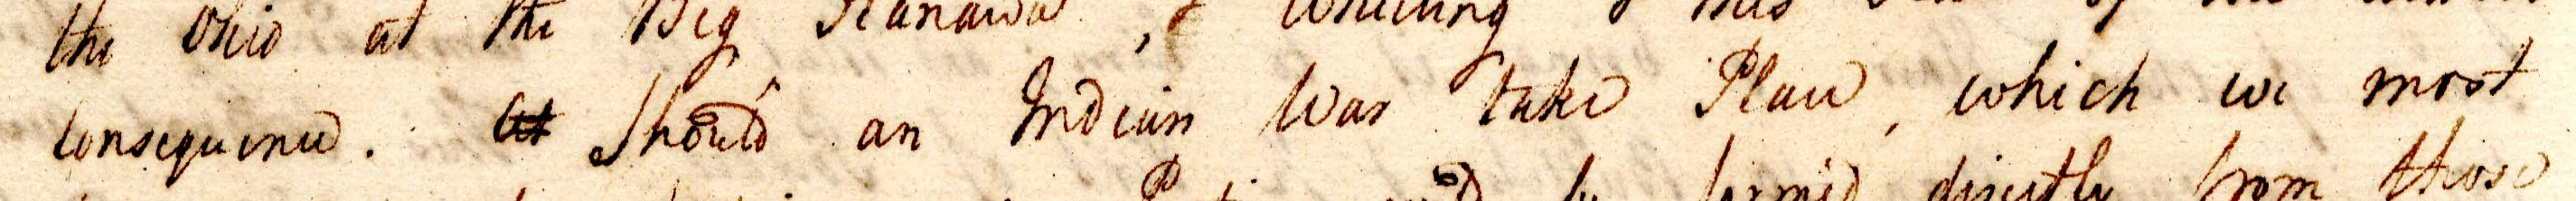consequence. Should an Indian War take Place, which we most
